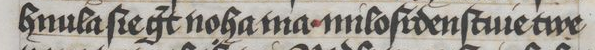hnula ſie ḡt noha ma.miloſrdenſtuíe twe
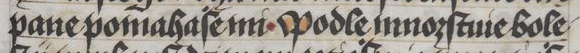pane pomahaẛe mi.Podle mnozſtuie bole¬
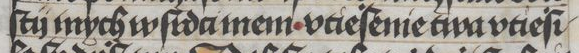ſtij mych w ſrdci mem.utieẛenie twa vtieẛi¬
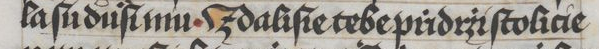la ſu duẛi mu.Zdaliſie tebe pṙidrżí ſtolicie
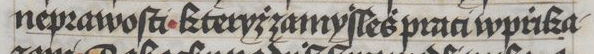neprawoſti.kteryż zamyẛleṡ praci wpṙika¬
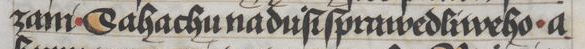zaní.Sahachu na duẛi ſprawedliweho.a
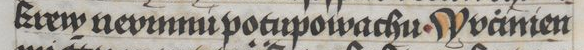krew nevinnu potupowachu.Y vċinien
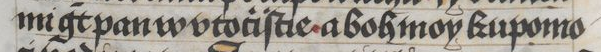mi ḡt pan w vtoċiẛtie.a boh moy kupomo¬
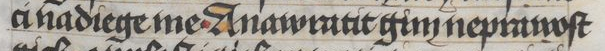ci nadiege me.A nawratit gim neprawoſt
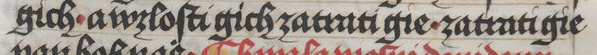gich.a wzloſti gich zatrati gie.zatrati gie
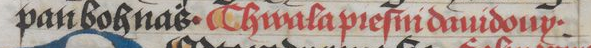pan boh naṡ.Chwala pieſni dauidouy.
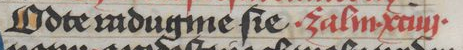Odte radugme ſie.żalm.xciiij.
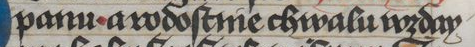panu.a rodoſtnie chwalu wzday¬
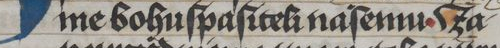me bohu ſpaſiteli naẛemu.Za¬
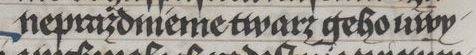neprażdnieme twarz geho uwy¬
